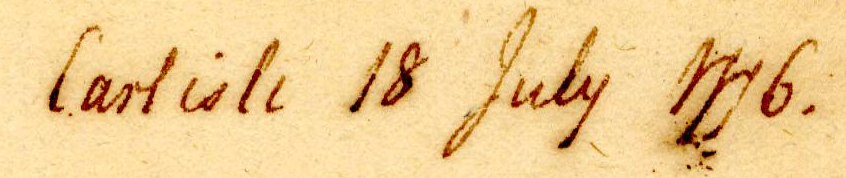Carlisle 18 July 1776.
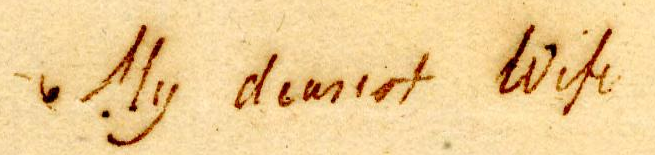My dearest Wife
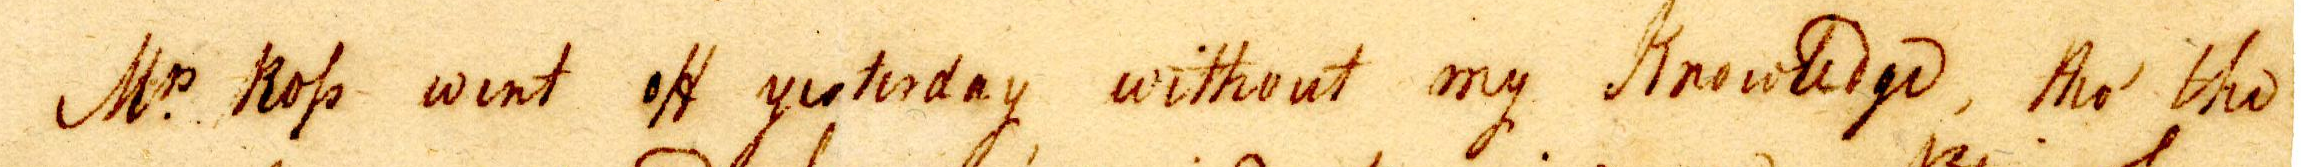M^rs. Ross went off yesterday without my Knowledge, tho' the
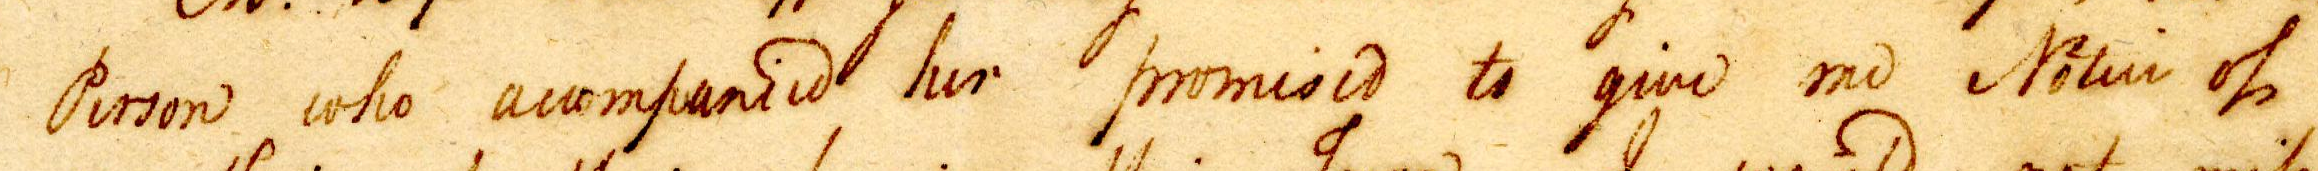Person who accompanied her promised to give me Notice of
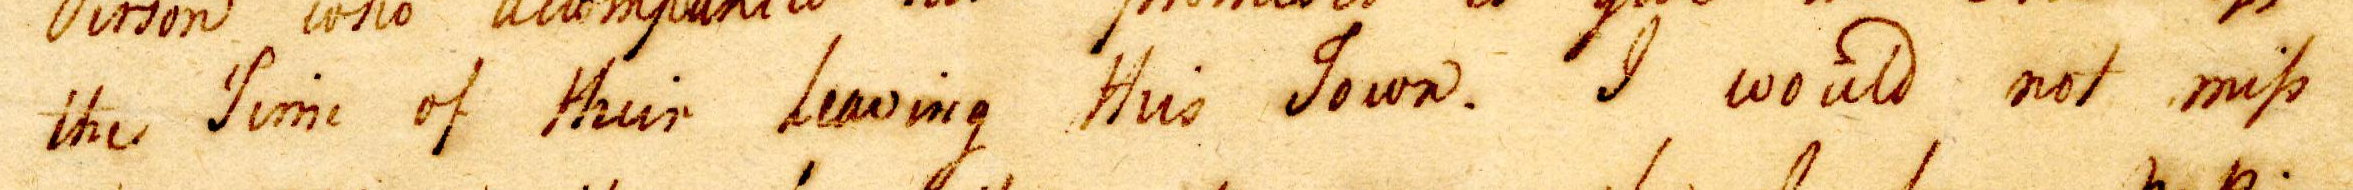the Time of their Leaving this Town. I would not miss
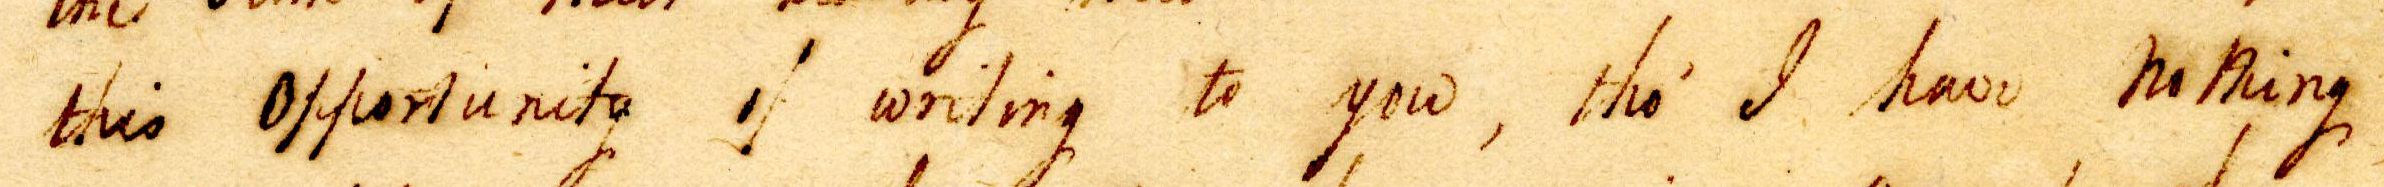this opportunity of writing to you, tho' I have Nothing
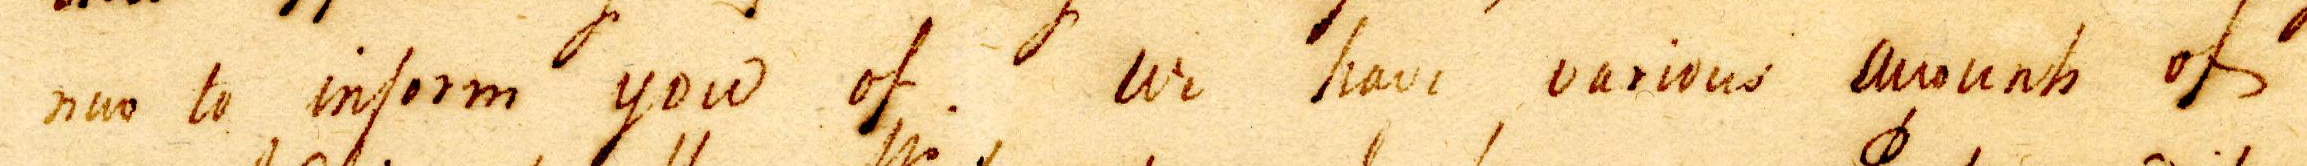new to inform you of. We have various Amounts of
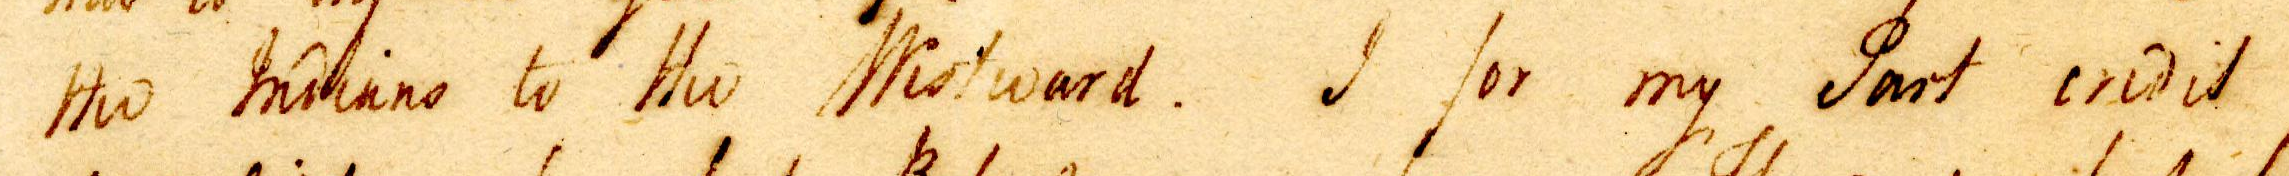the Indians to the Westward. I for my Part credit
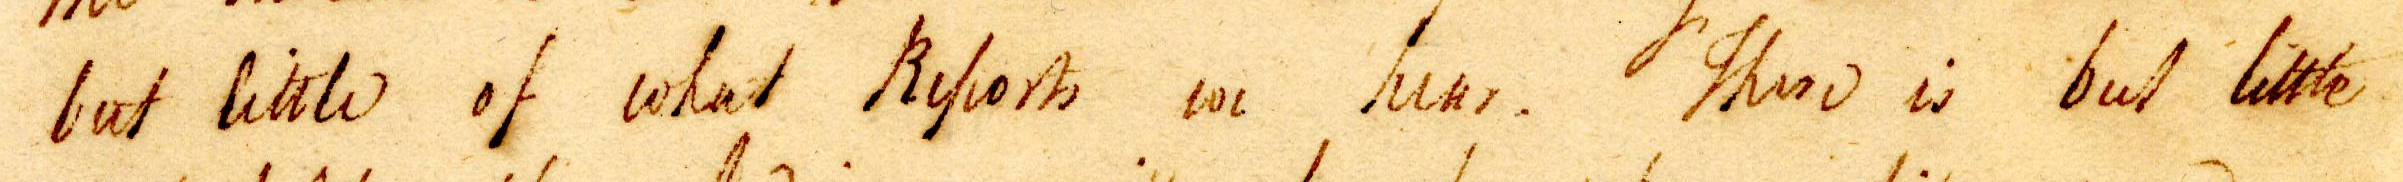but little of what Reports we hear. There is but little
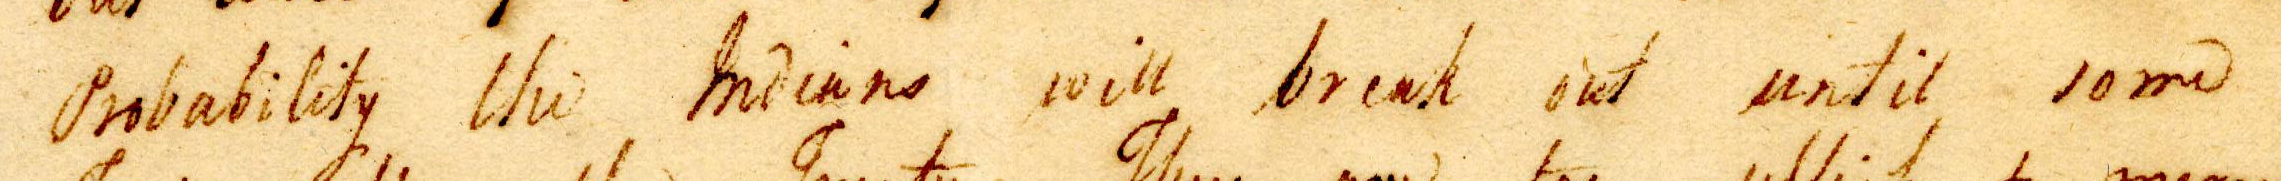Probability the Indians will break out until some
